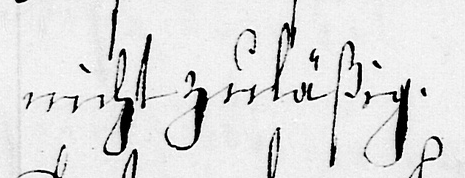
nicht zuläßig.
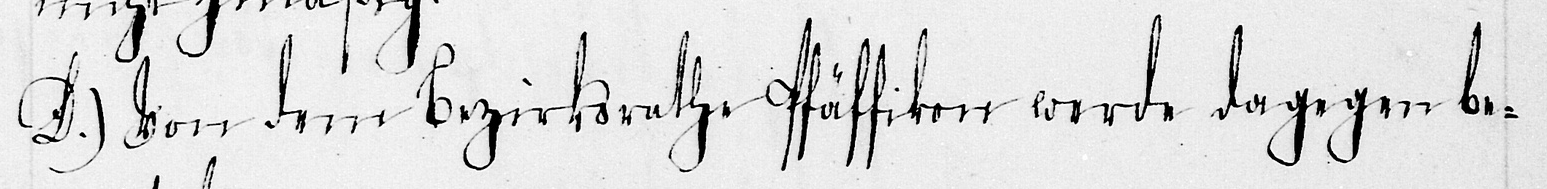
D.) Von dem Bezirksrathe Pfäffikon werde dagegen be¬
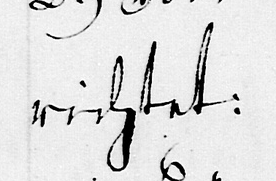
richtet:
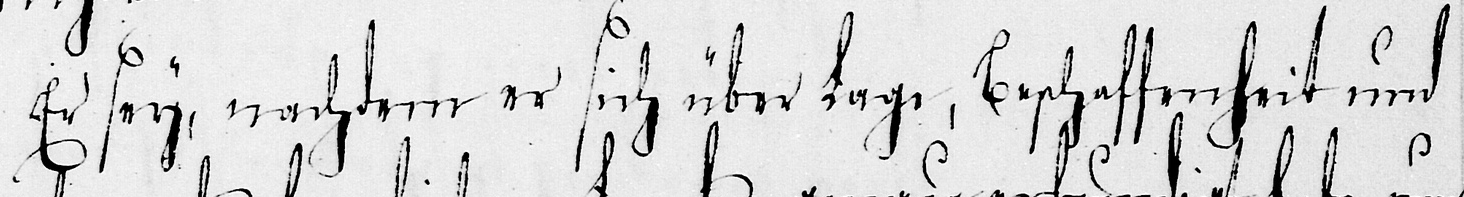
Es sey, nachdem er sich über Lage, Beschaffenheit und
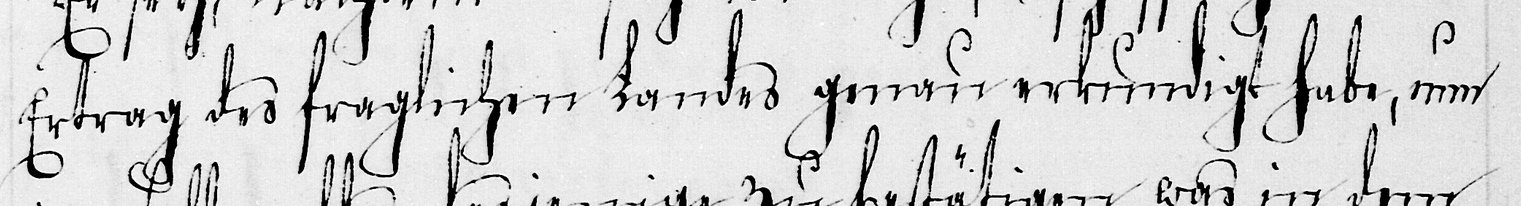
Ertrag des fraglichen Landes genau erkundigt habe, nun
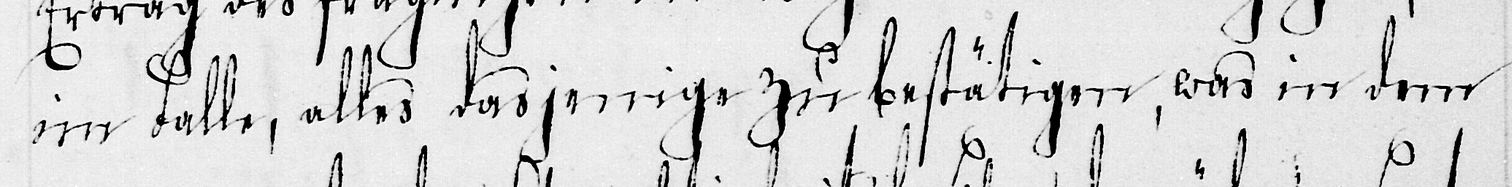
im Falle, alles dasjenige zu bestätigen, was in dem
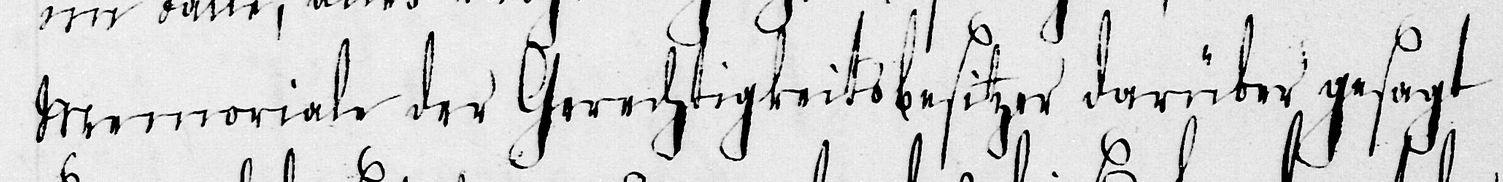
Memoriale der Gerechtigkeitsbesitzer darüber gesagt
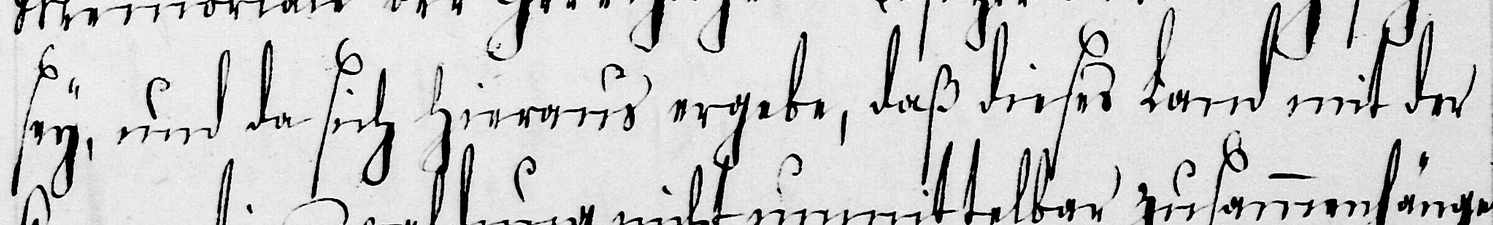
sey, und da sich hieraus ergebe, daß dieses Land mit der
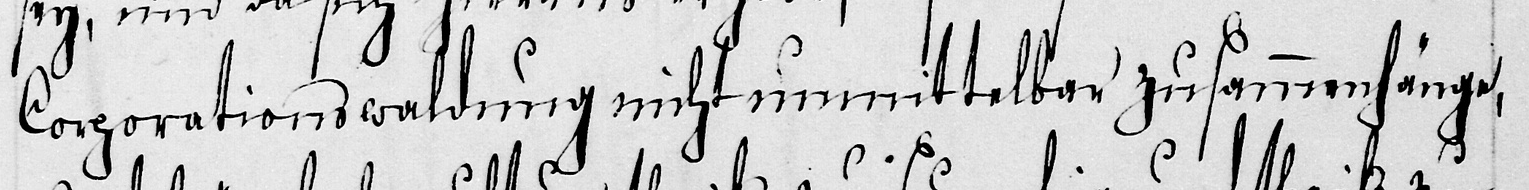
Corporationswaldung nicht unmittelbar zusammenhänge,
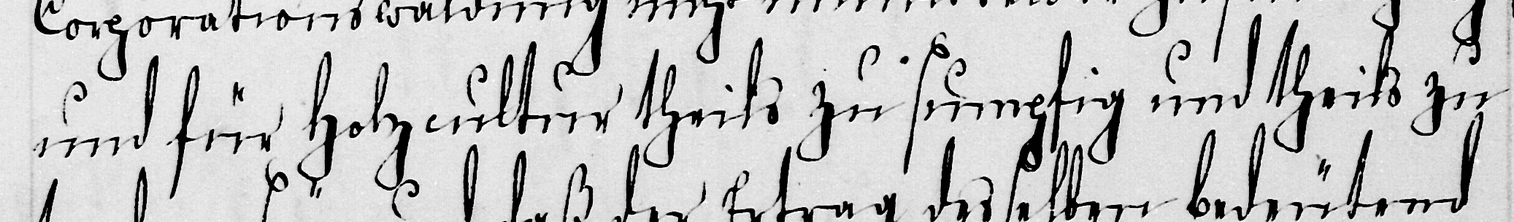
und für Holzcultur theils zu sumpfig und theils zu
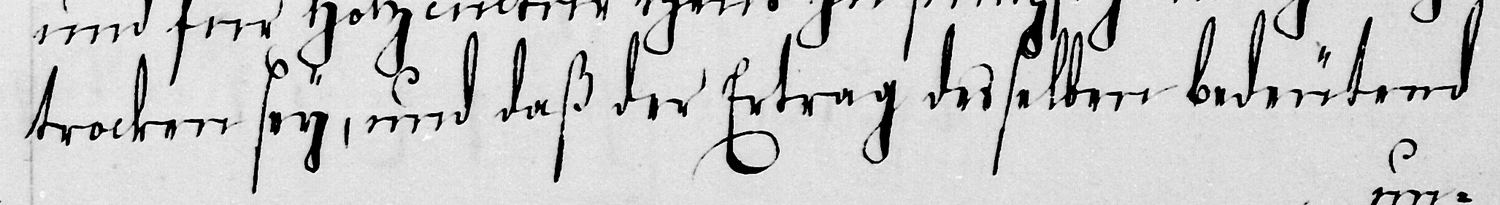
trocken sey, und daß der Ertrag desselben bedeutend
